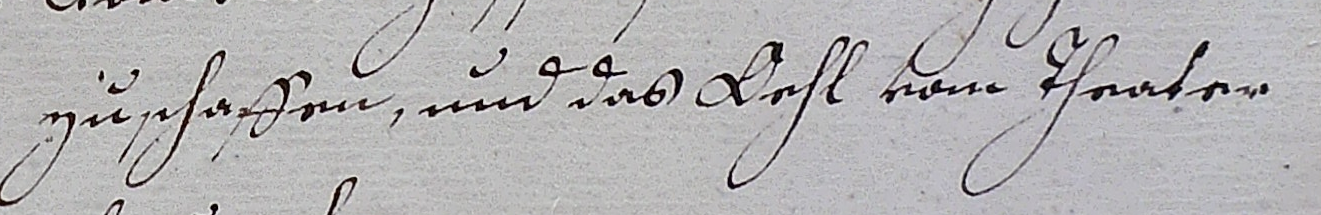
zuschaffen, und das Oehl von Theater
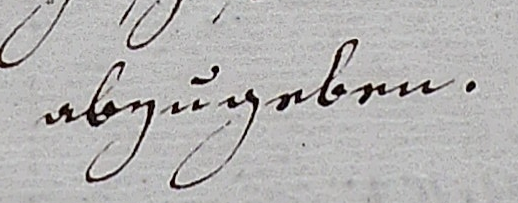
abzugeben.
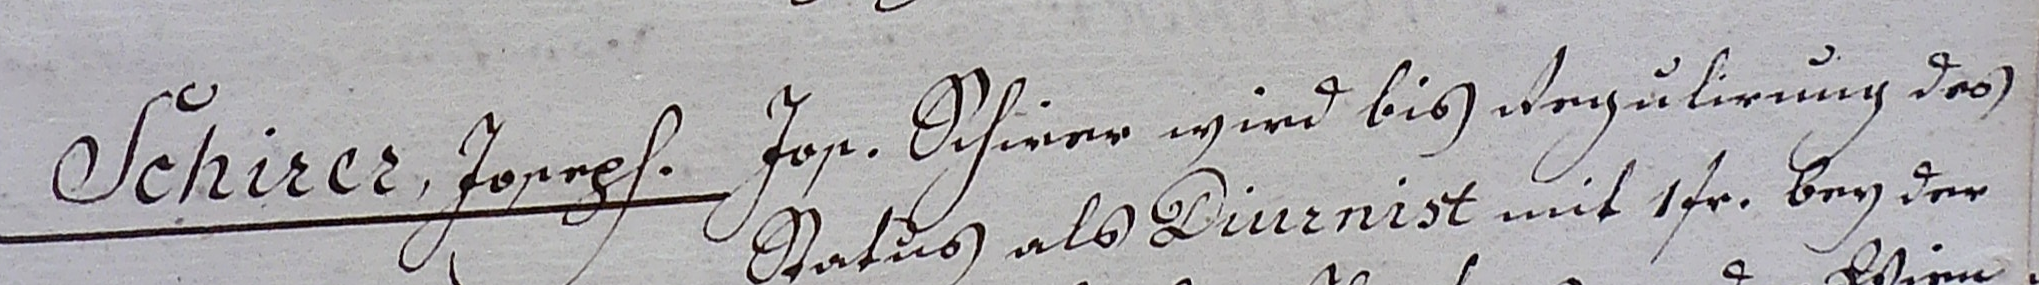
Schirer, Joseph. Jos. Schier wird bis Regulirung des
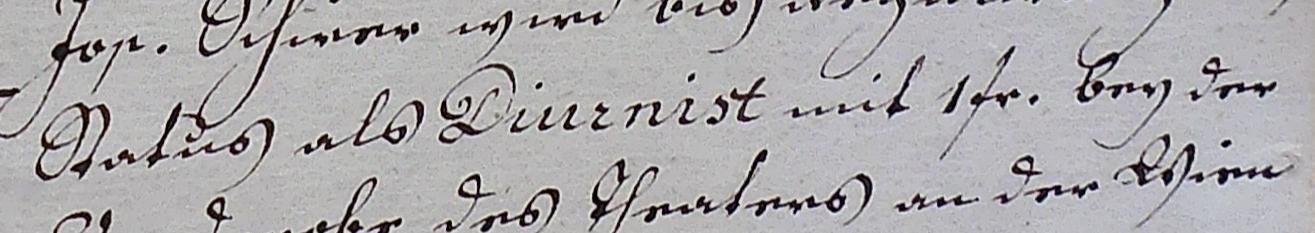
Status als Diurnist mit 1fr. bey der
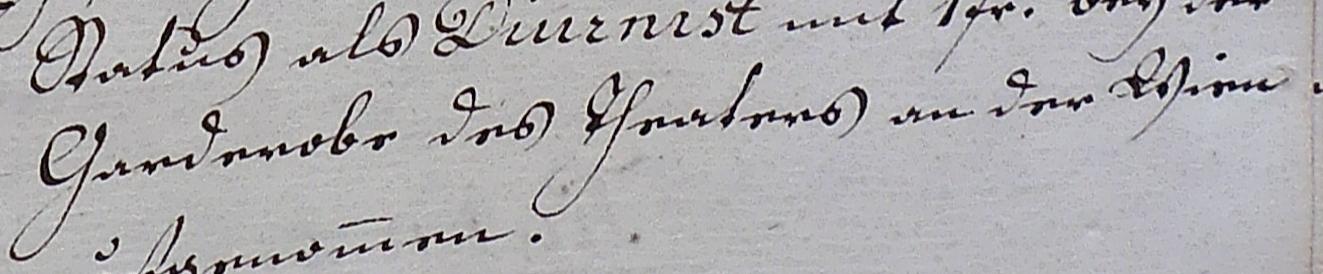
Garderobe des Theaters an der Wien
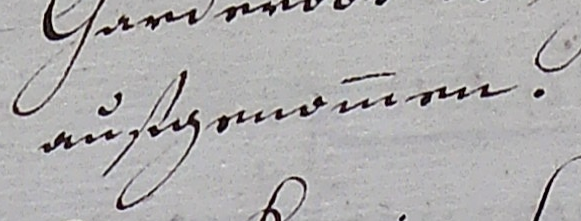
aufgenom̅en.
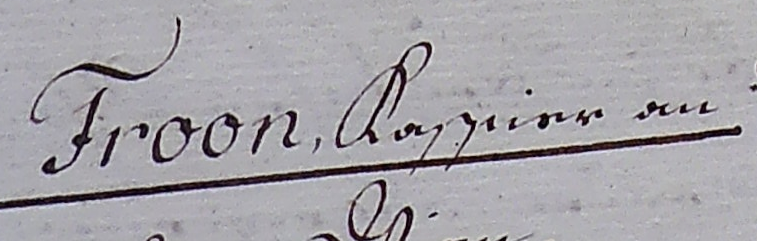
Froon, Kassier an
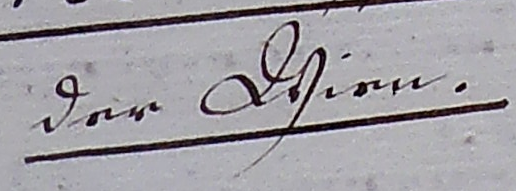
der Wien.
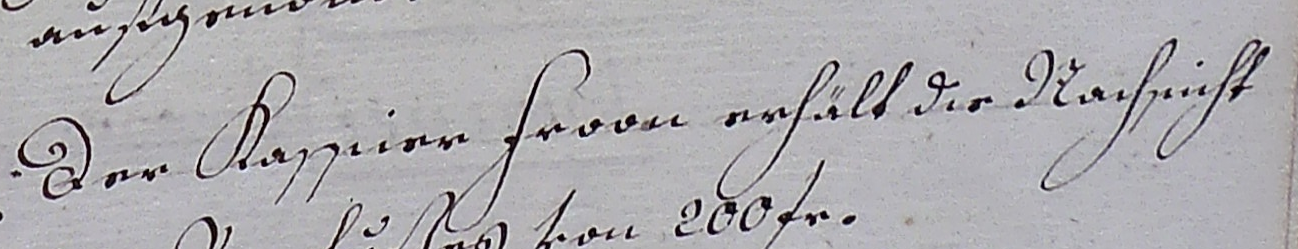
Der Kassier Froon erhält die Nachsicht
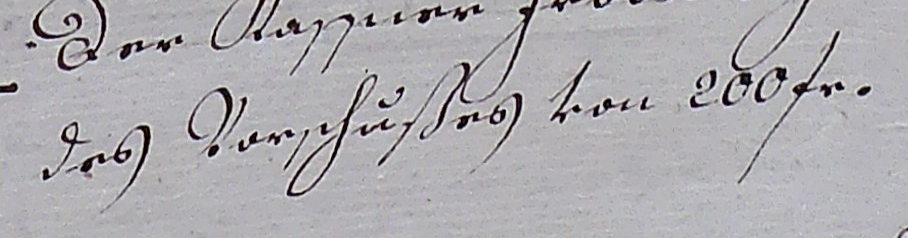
des Vorschußes von 200fr.
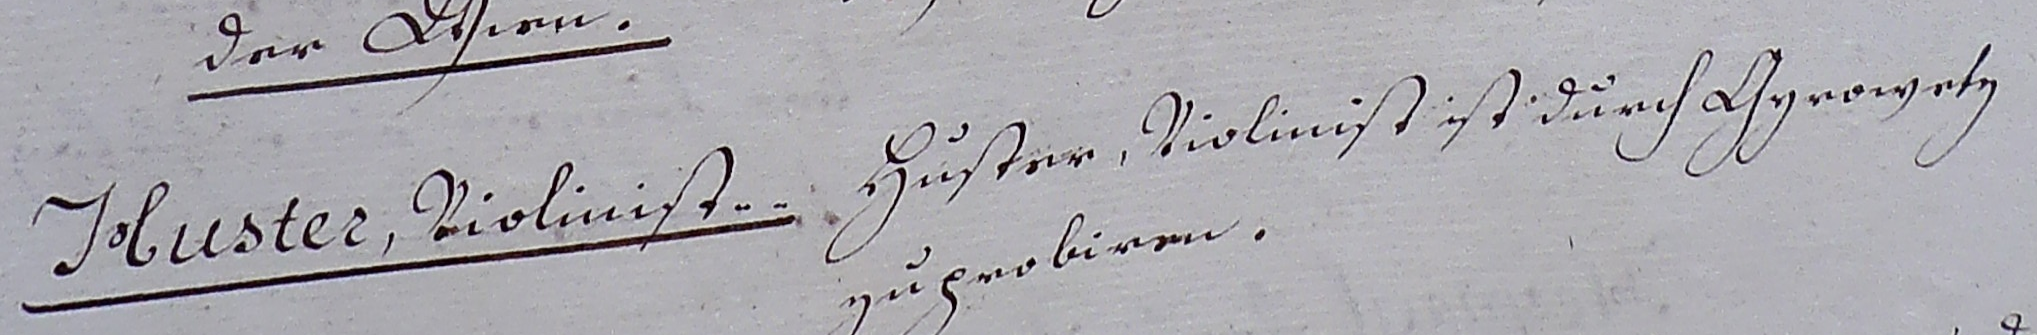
Huster, Violinist .. .. Huster, Violinist ist durch Gyrowetz
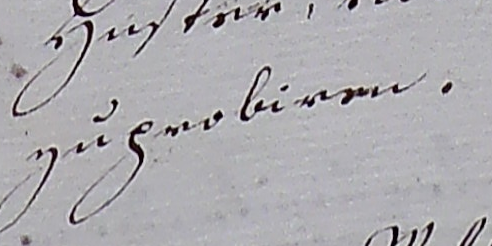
zuprobiren.
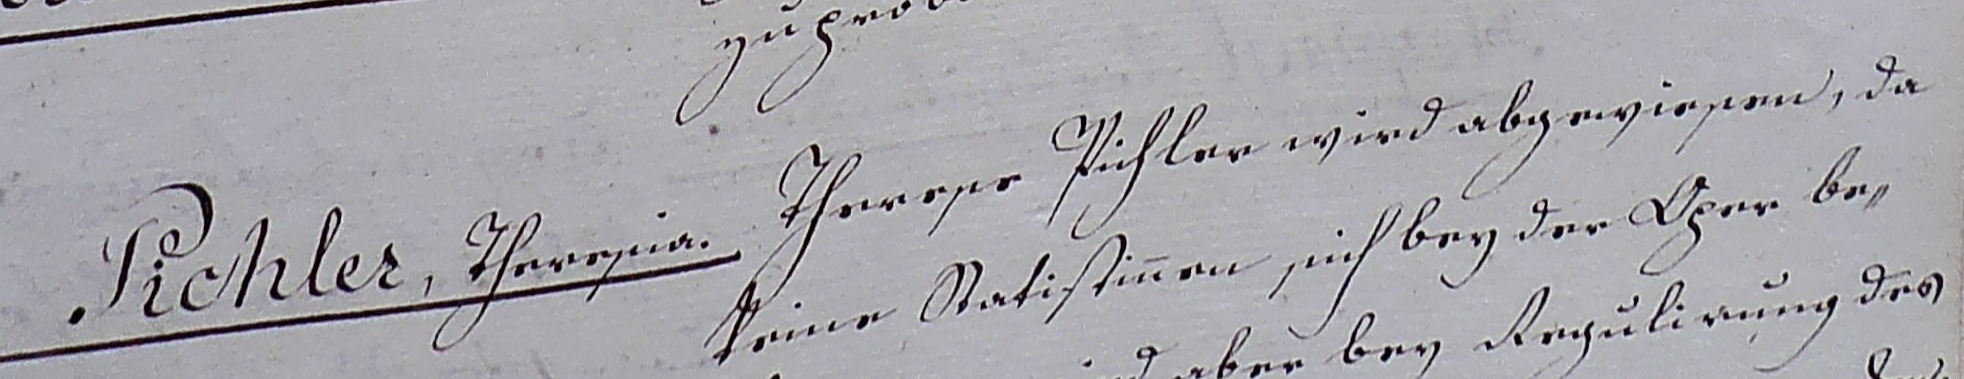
Pichler, Theresia. Therese Pichler wird abgewiesen, da
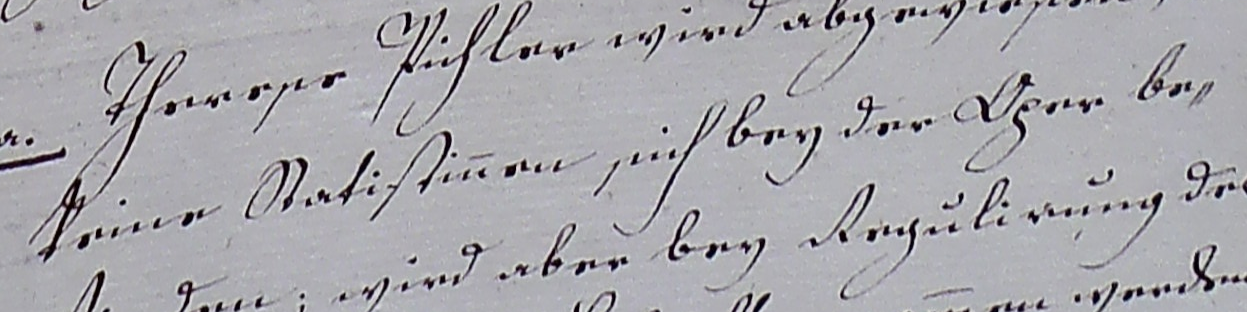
keine Statistin̅en sich bey der Oper be¬
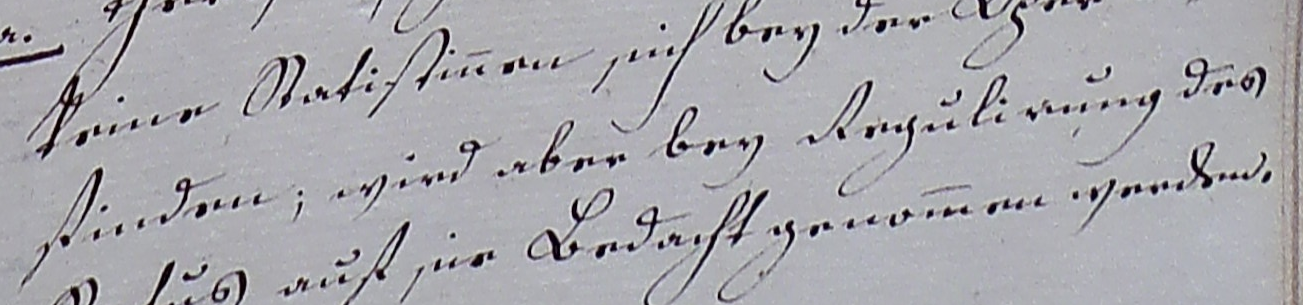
finden; wird aber bey Regulirung des
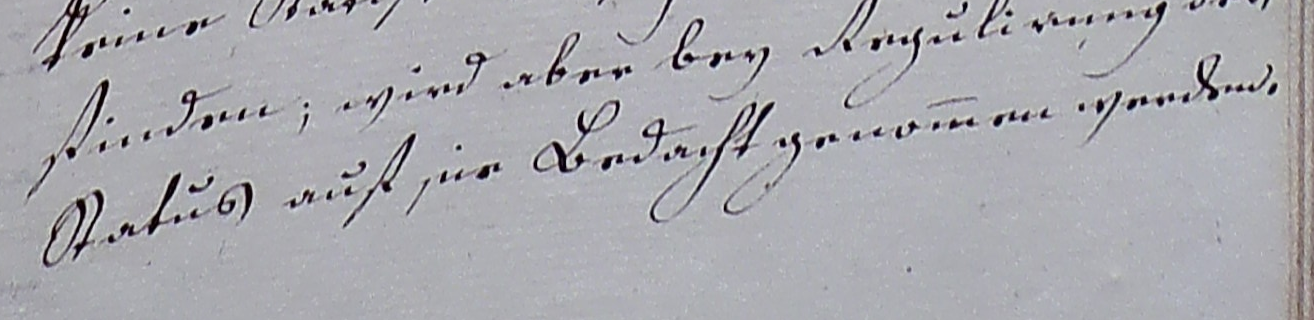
Status auf sie Bedacht genom̅en werden.
